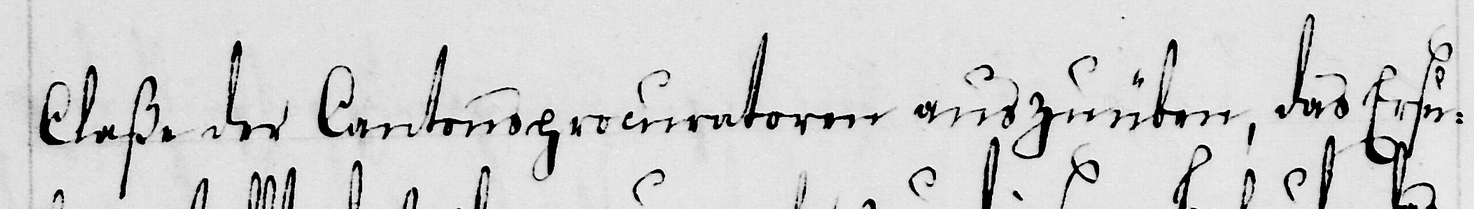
Claße der Cantonsprocuratoren auszuüben, das Ersu¬
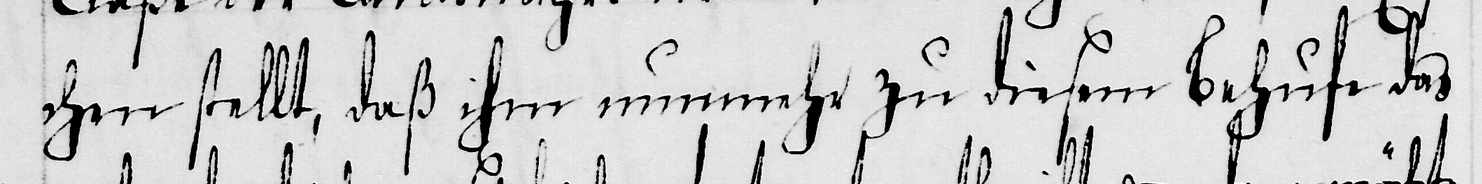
chen stellt, daß ihm nunmehr zu diesem Behufe das
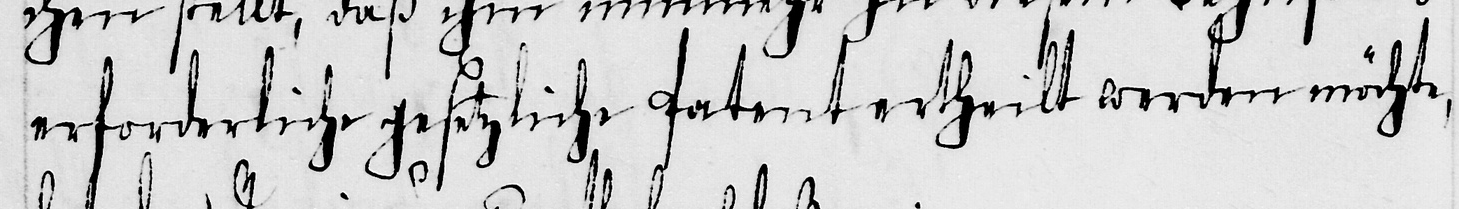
erforderliche gesetzliche Patent ertheilt werden möchte,
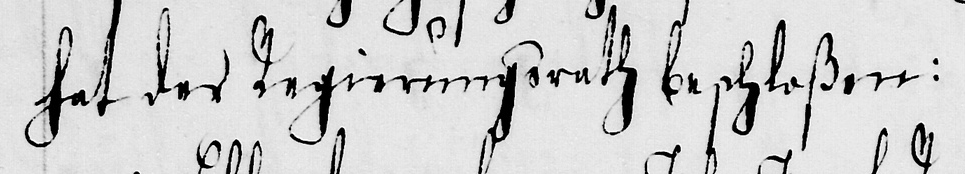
hat der Regierungsrath beschloßen:
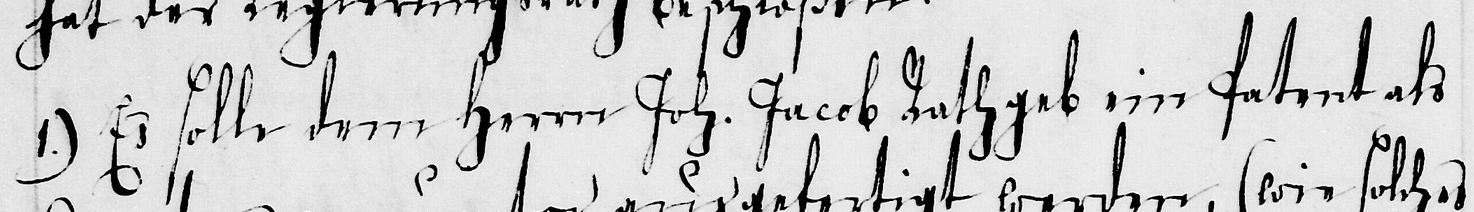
1.) Es solle dem Herrn Joh. Jacob Rathgeb ein Patent als
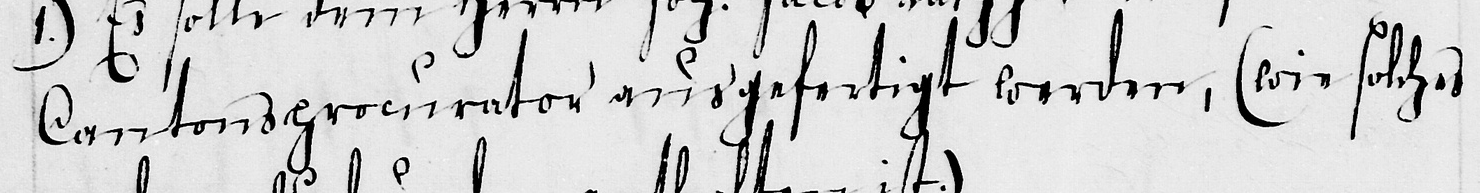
Cantonsprocurator ausgefertigt werden, (wie solches
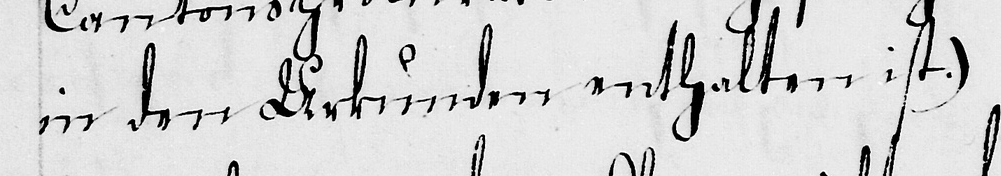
in den Urkunden enthalten ist.)
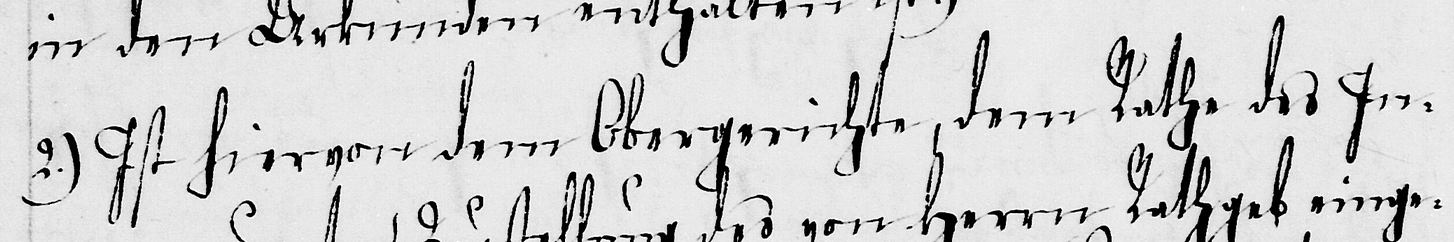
2.) Ist hiervon dem Obergerichte dem Rathe des In¬
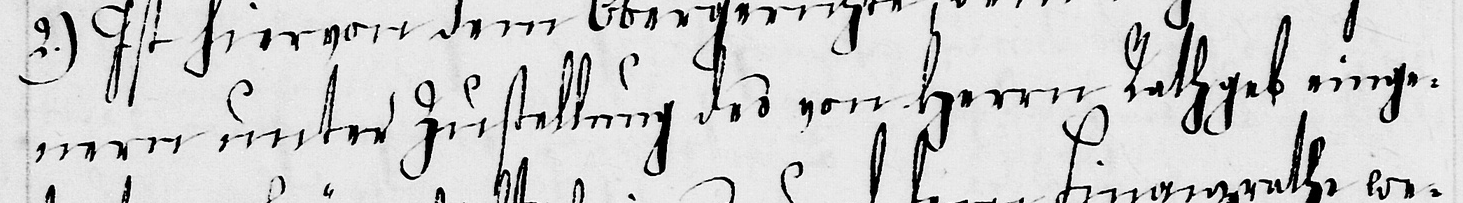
nern unter Zustellung des von Herrn Rathgeb einge¬
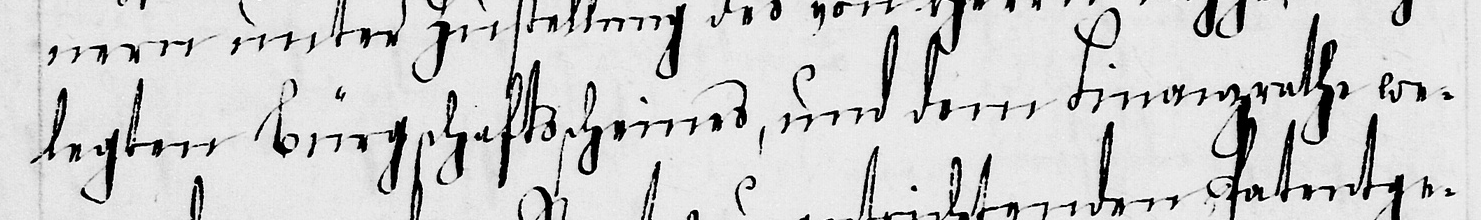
legten Bürgschaftsscheines, und dem Finanzrathe we¬
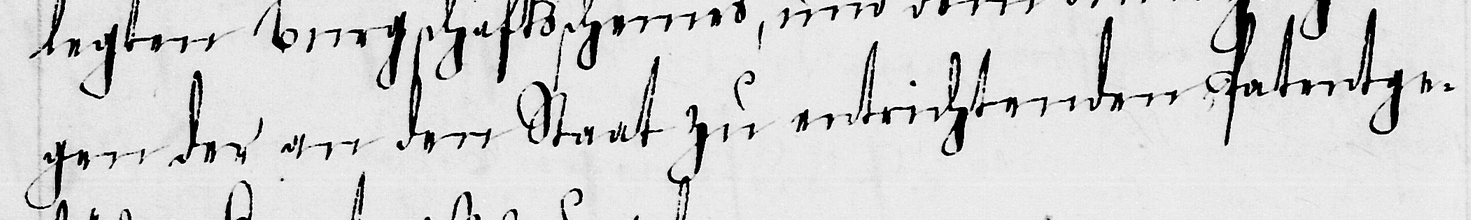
gen der an den Staat zu entrichtenden Patentge¬
